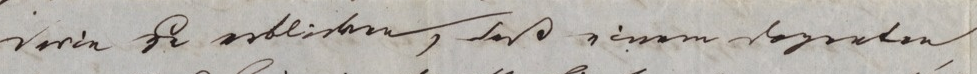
darin zu erblicken, daß einem Dozenten,
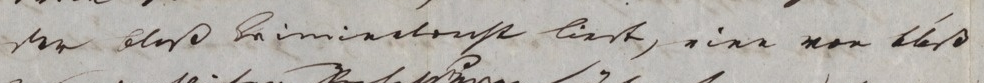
der bloß Criminalrecht liest, eine von bloß
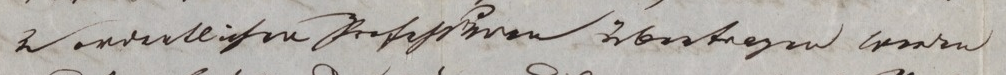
3 ordentlichen Professuren übertragen werden
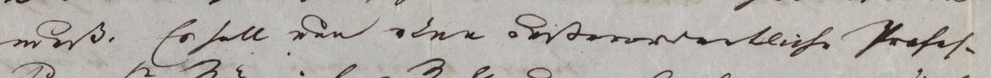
muß. Es soll nun eine außerordentliche Profes-
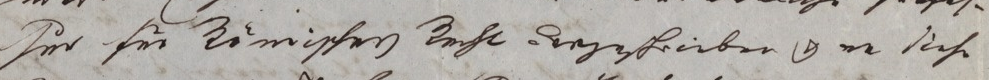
sur für Römisches Recht ausgeschrieben & an diese
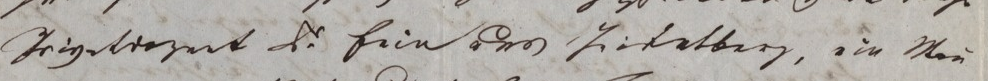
Privatdozent Dr. Fein aus Heidelberg, ein Mann
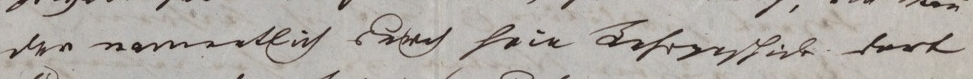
der namentlich durch sein Lehrgeschick dort
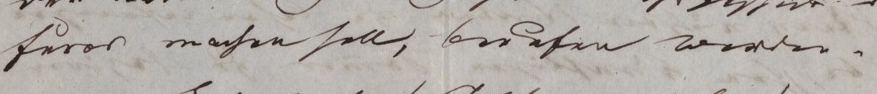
Furor machen soll, berufen werden.
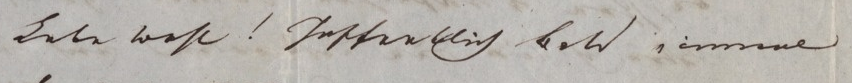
Lebe wohl! Hoffentlich bald einmal
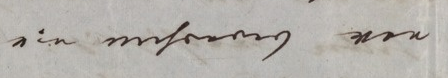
ein mehreres von
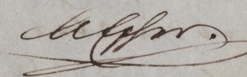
A Escher.
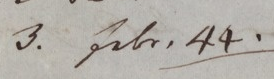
3. Febr. 44.
